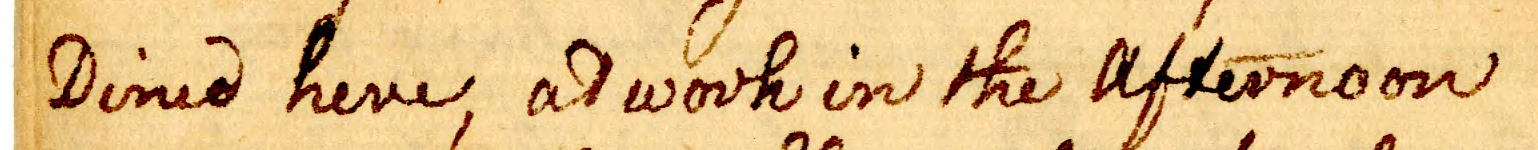Dined here, at work in the Afternoon
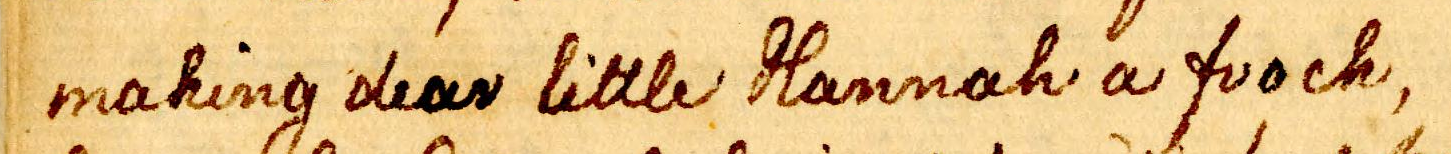making dear little Hannah a frock,
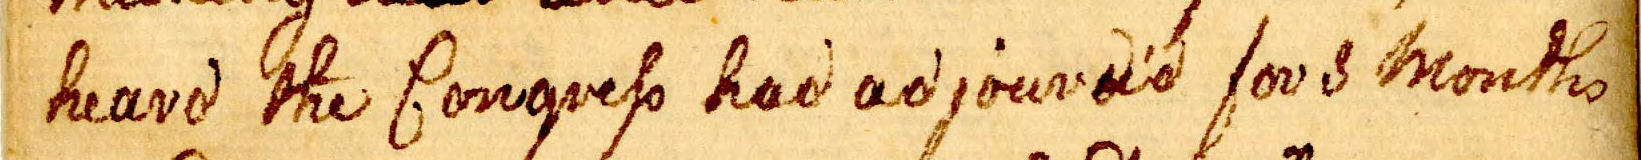heard the Congress had adjourn'd for 3 Months
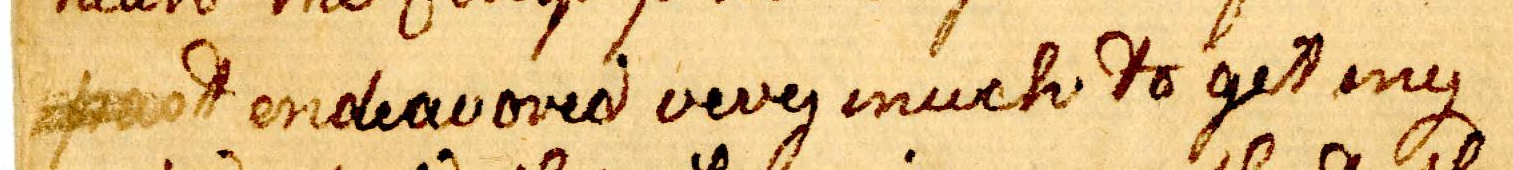past endeavored very much to get my
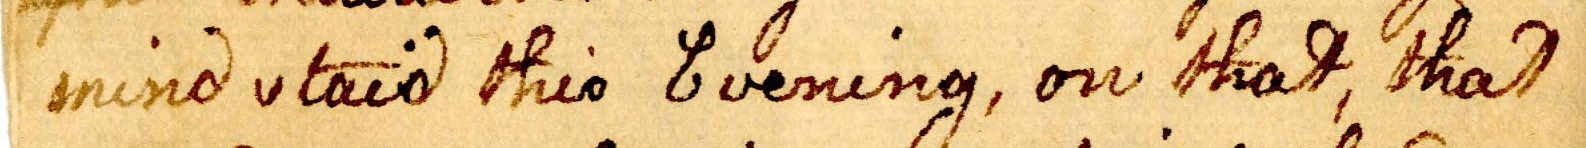mind staid this Evening, on that, that
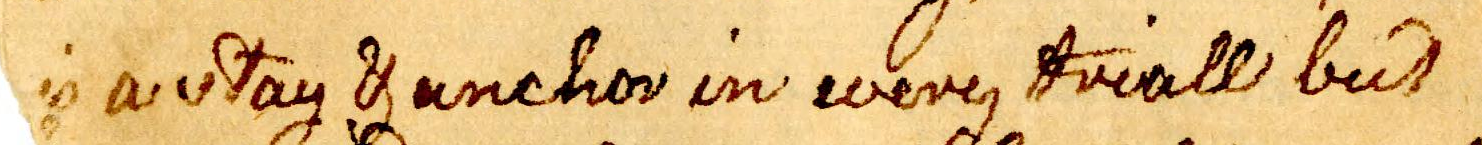is a stay & anchor in every triall but
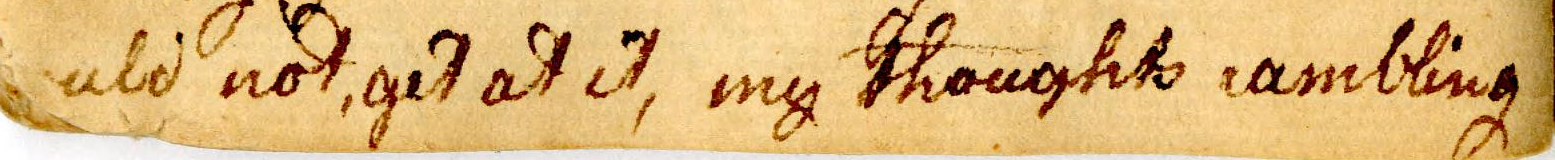uld not, get at it, my thoughts rambling
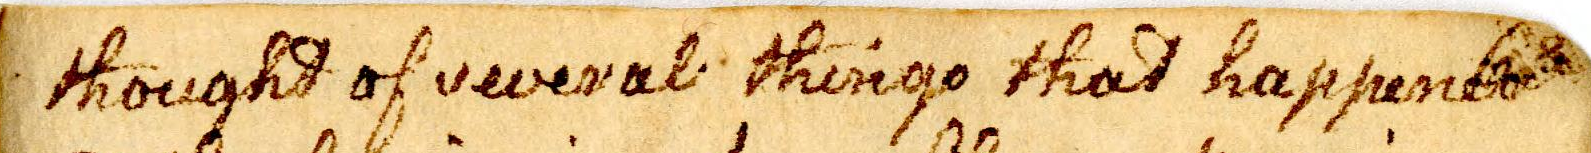thought of several things that happened
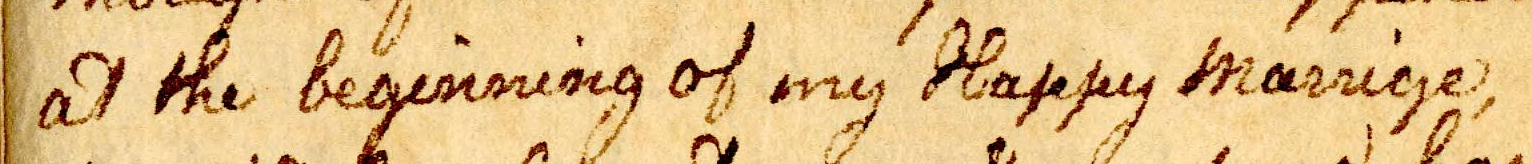at the beginning of my Happy Marrige,
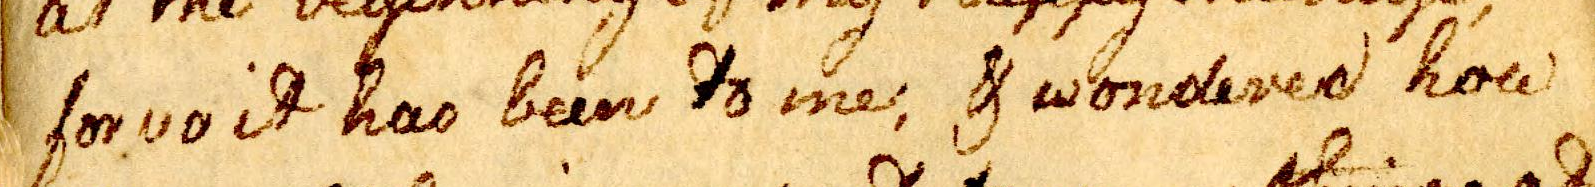for so it has been to me, & wondered how
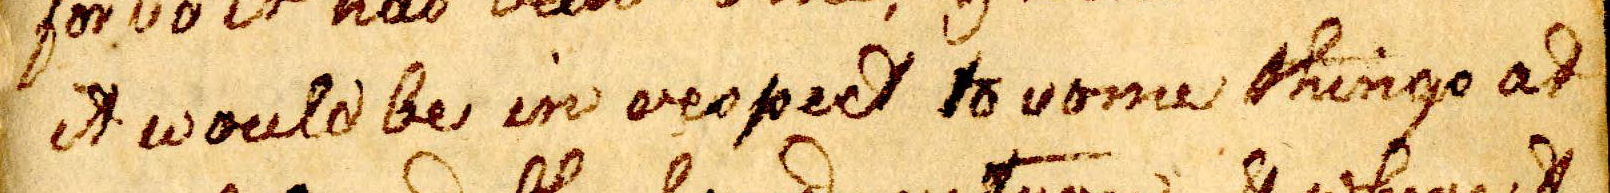it would be in respect to some things at
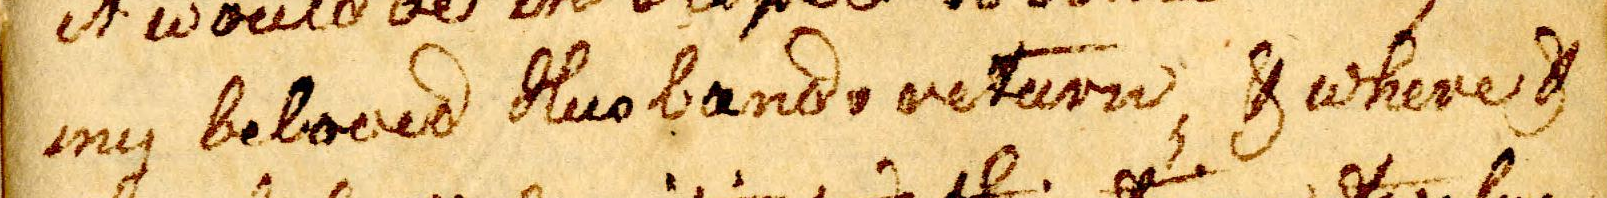my beloved Husbands return, & where &
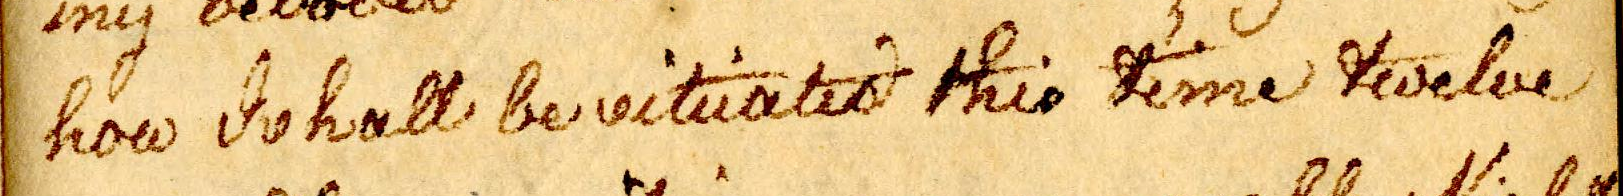how I shall be situated this time twelve
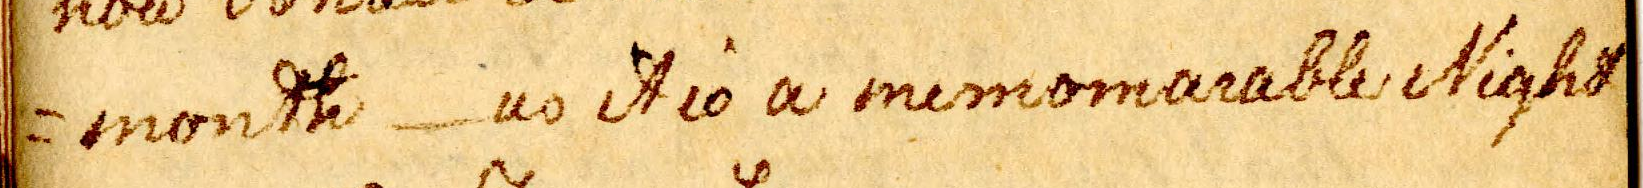-month- as it is a memomarable Night
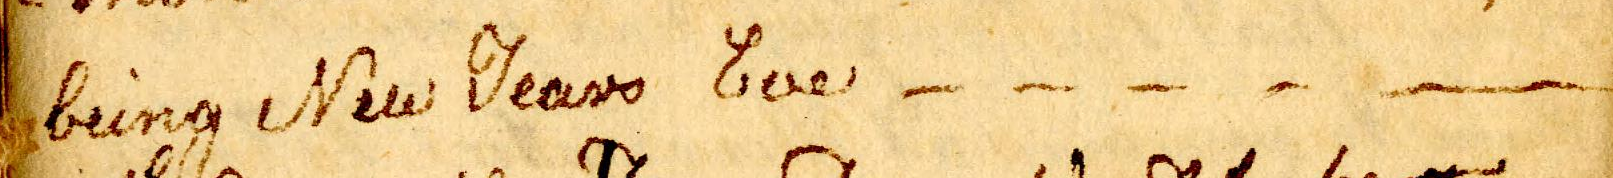being New Years Eve - - - - -
